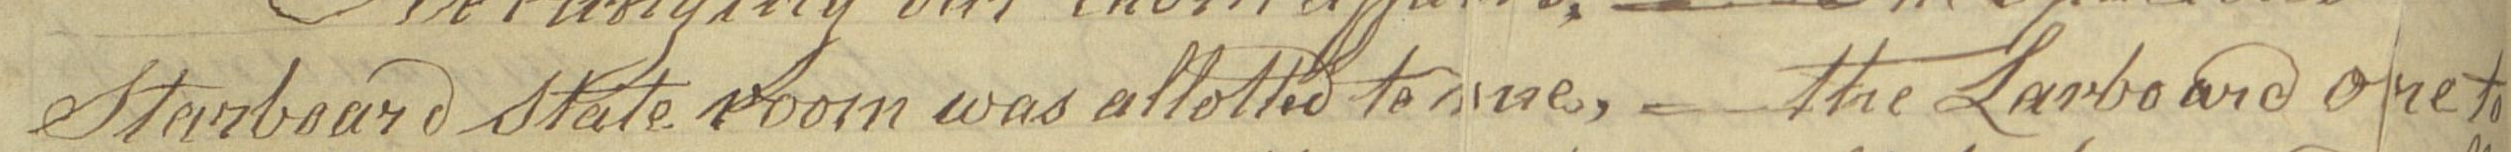Starboard State room was allotted to me, the Larboard one to
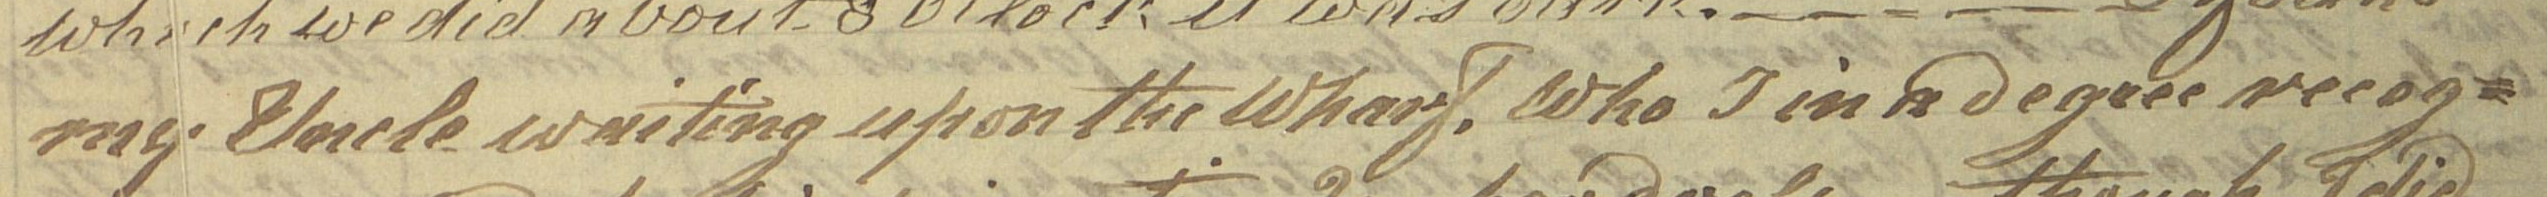my Uncle writing upon the Wharf. Who I in a degree recog-
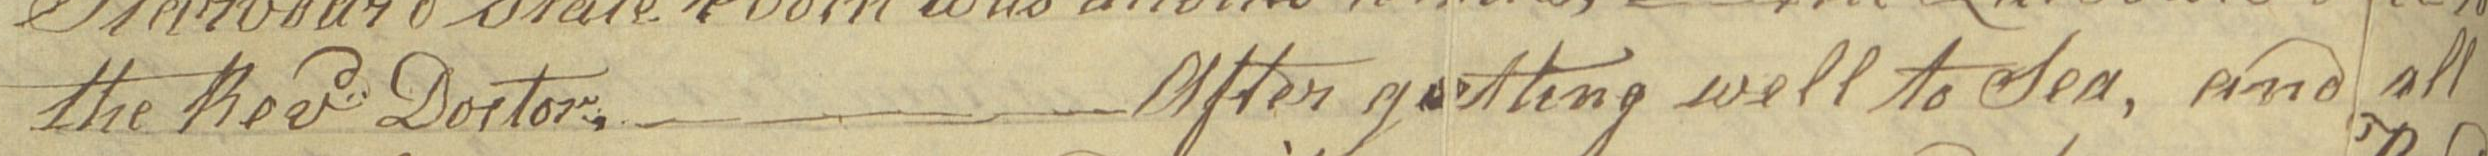the Rev^d Doctor. After getting well to Sea, and all
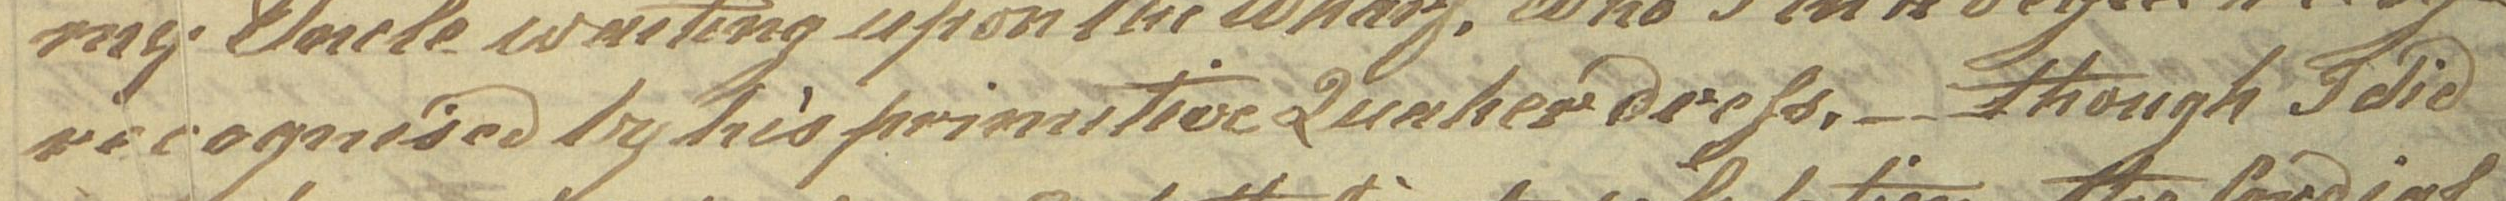recognised by his primitive Quaker dress. Though I did
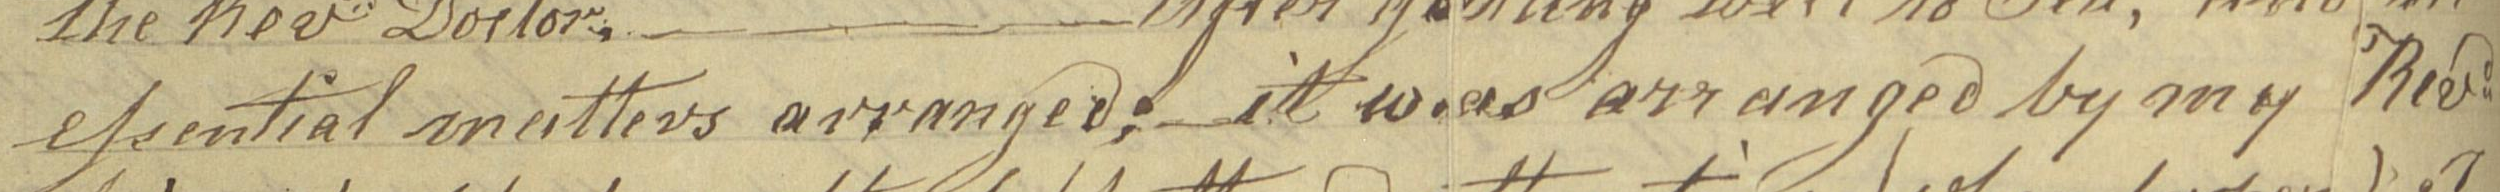essential matters arranged; it was arranged by my Rev^d
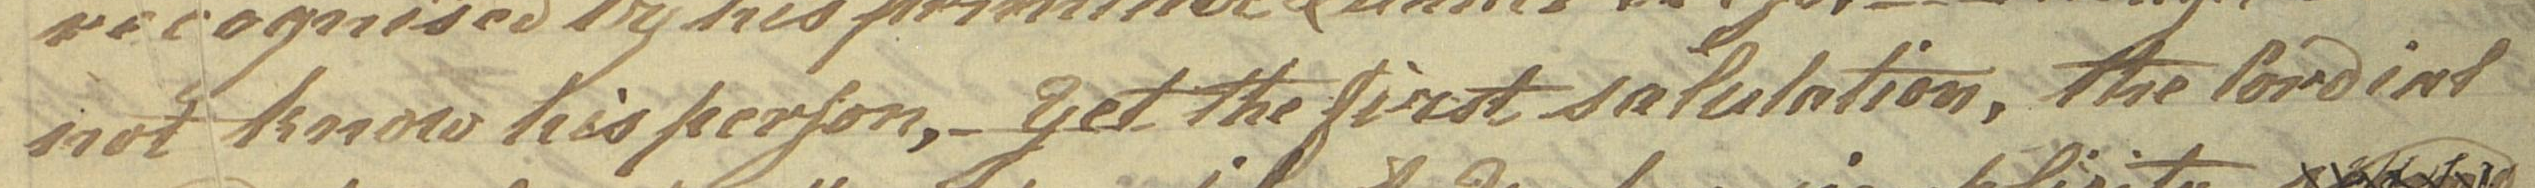not know his person, yet the first salutation, the Cordial
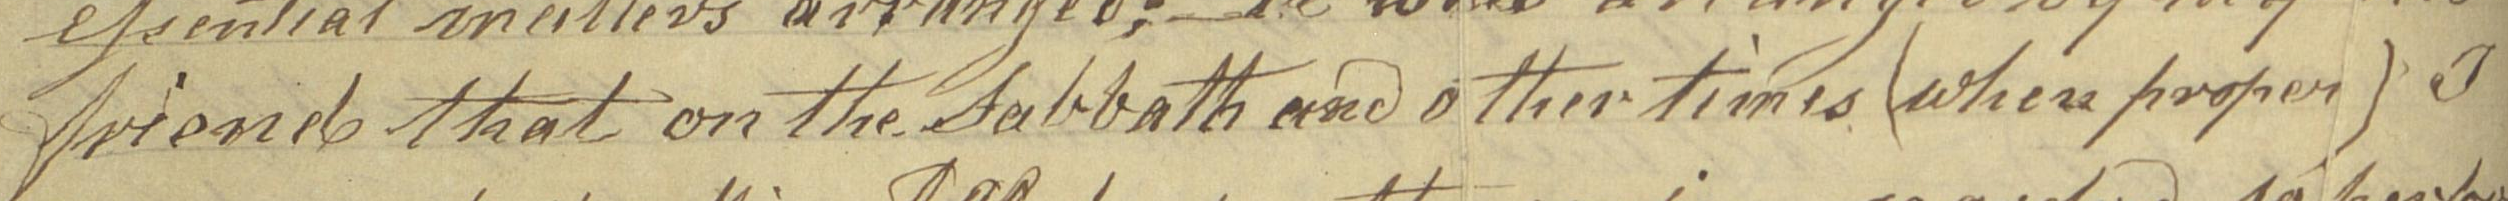friend that on the Sabbath and other times (where proper) I
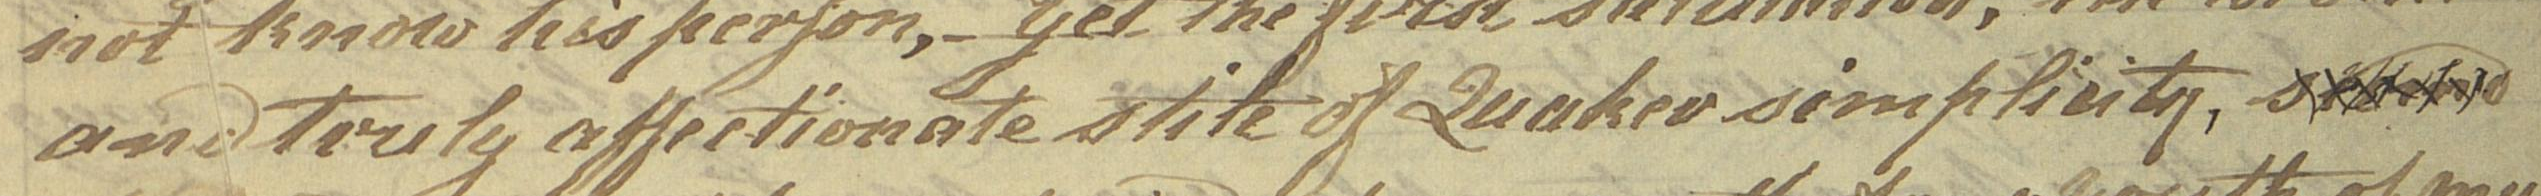and truly affectionate stile of Quaker simplicity, seemd
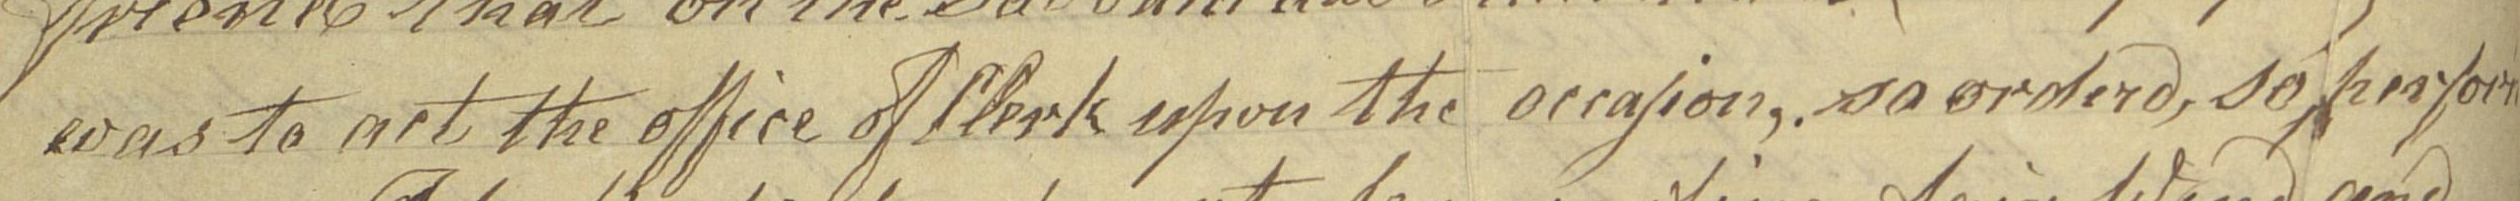was to act the office of Clerk upon the occasion, so orderd, so perform-
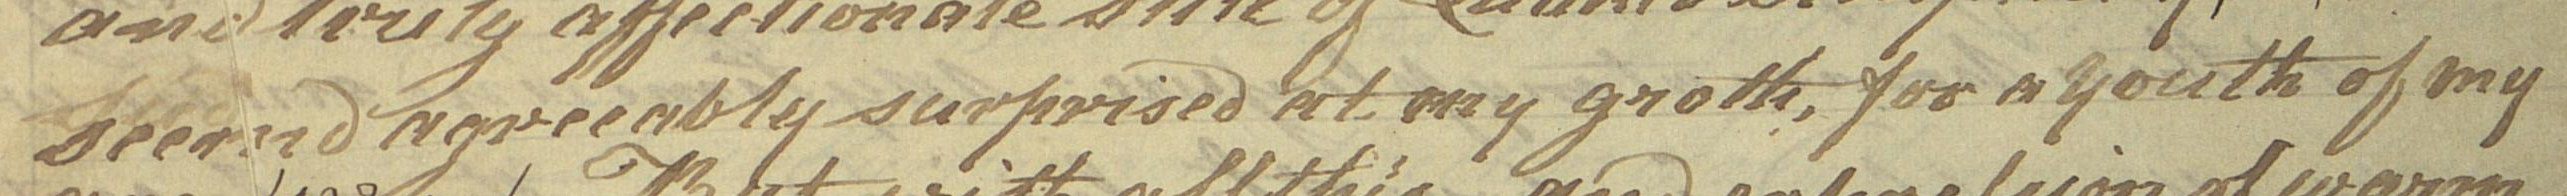seemd agreeably surprised at my groth, for a youth of my
